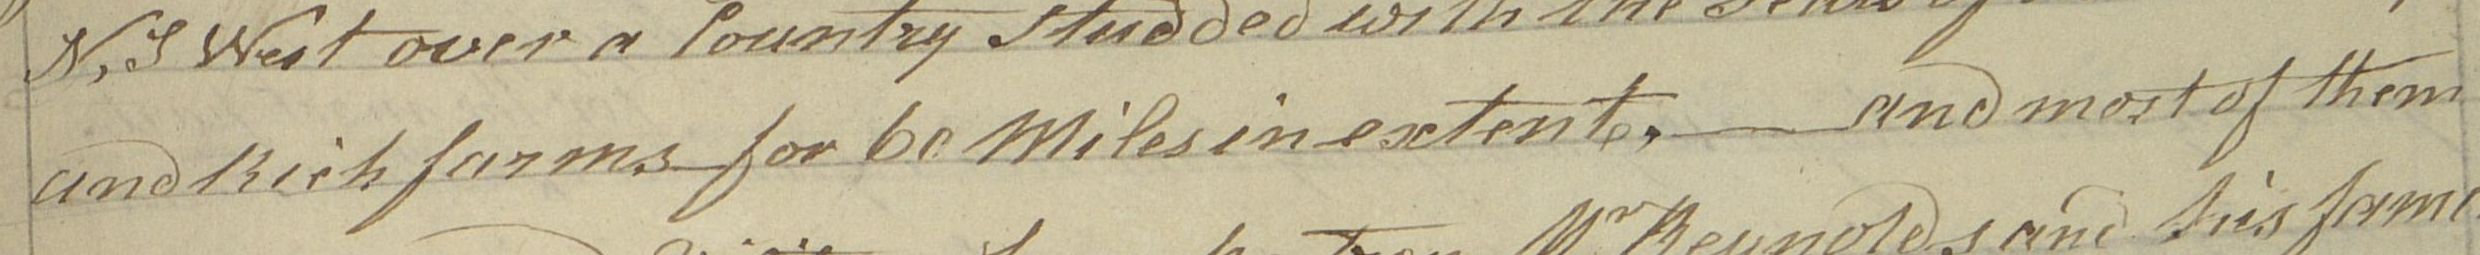and Rich farms for 60 Miles in extent, and most of them
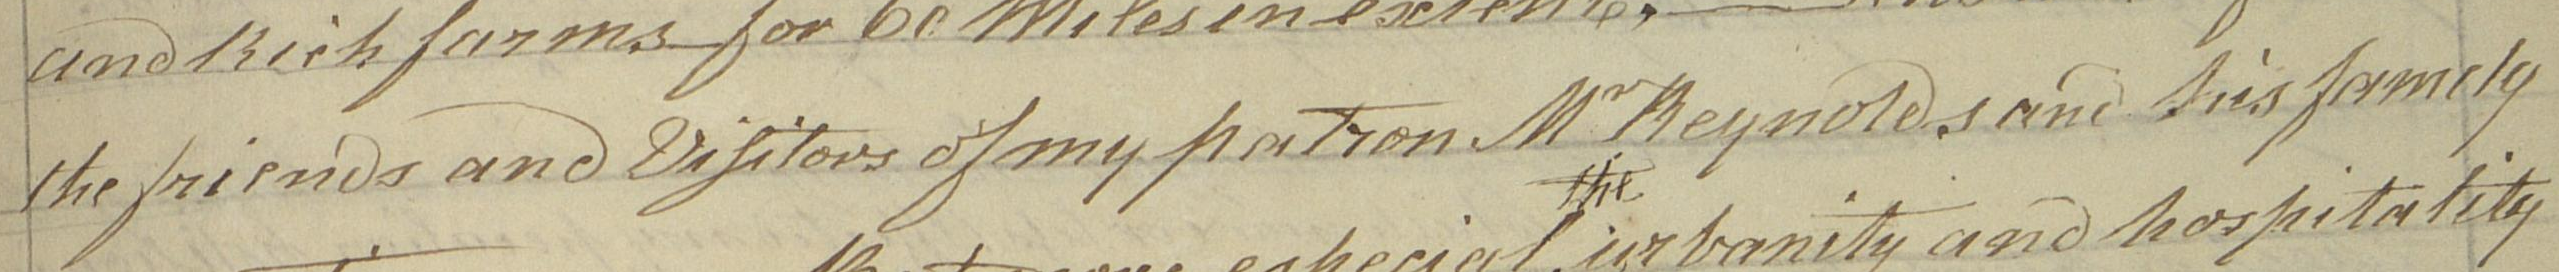the friends and Visitors of my patron M^r Reynolds and his family
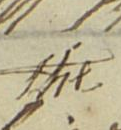the
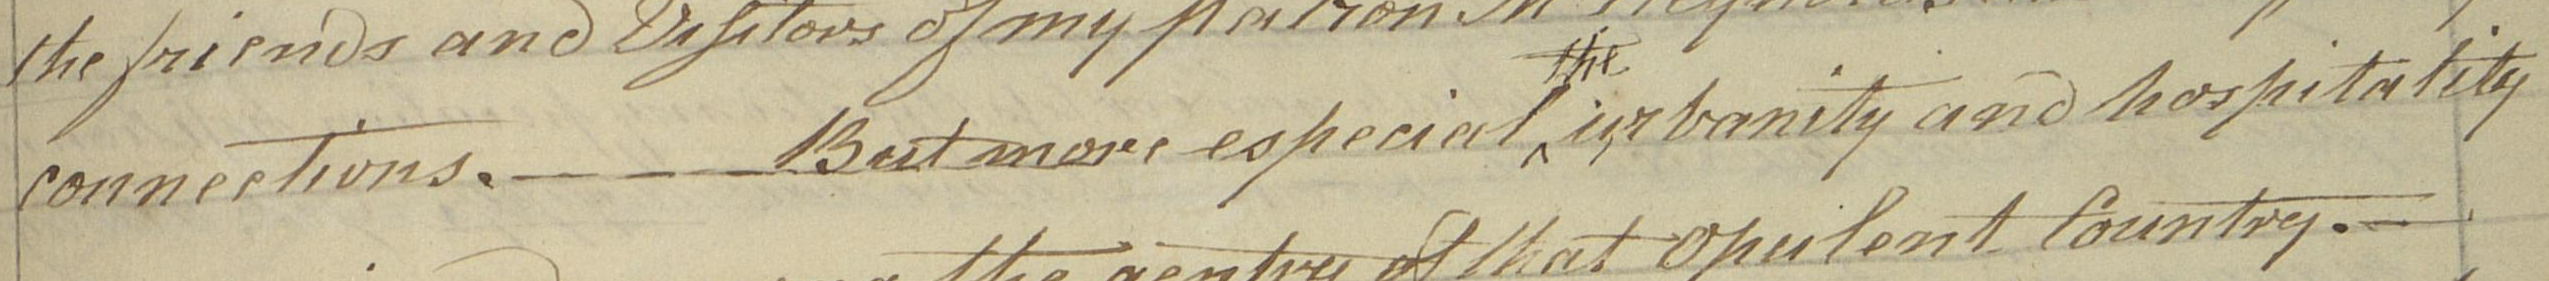connections. But more especial ^ urbanity and hospitality
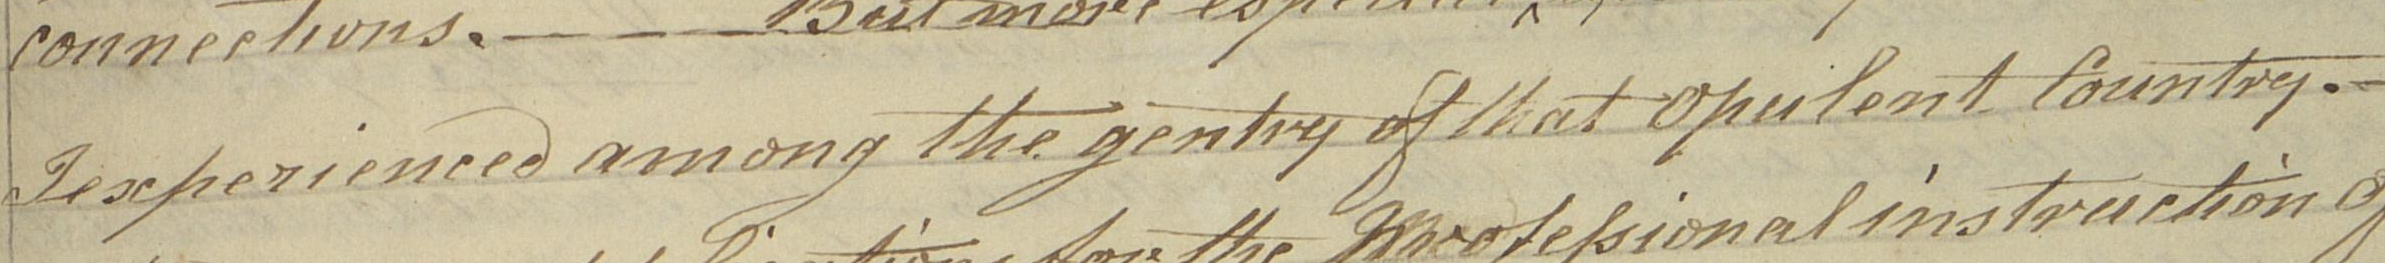I experienced among the gentry of that opulent Country.
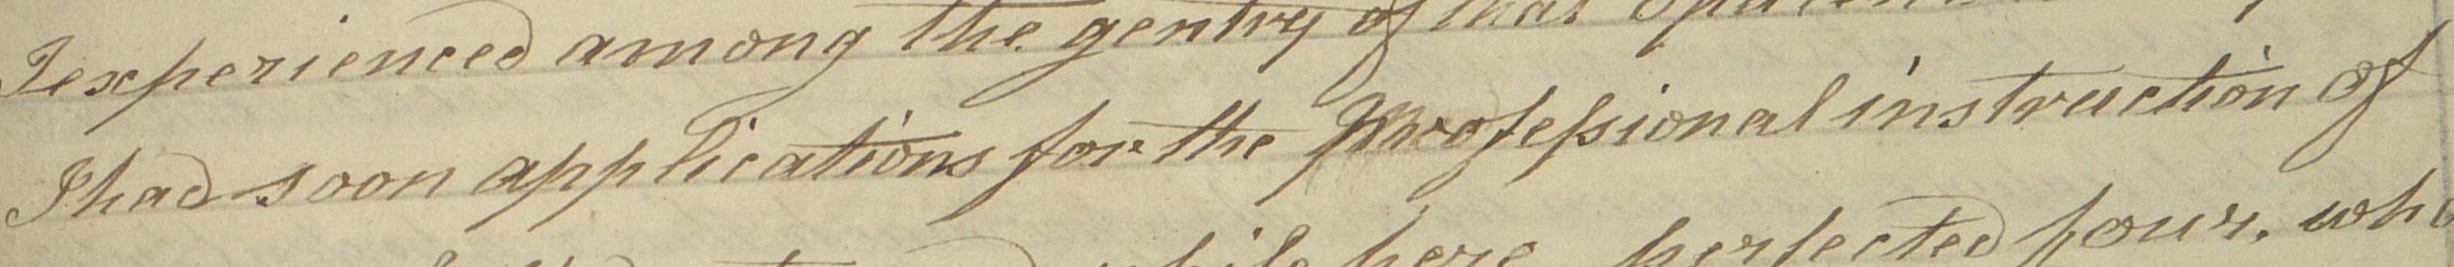(I had soon applications for the professional instruction of
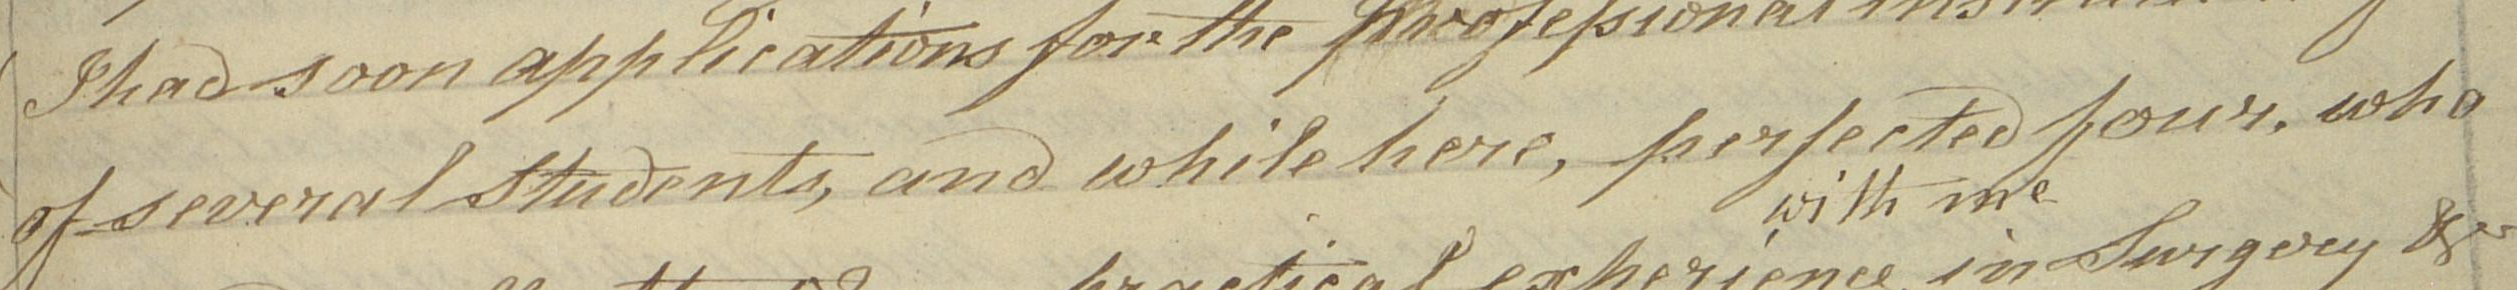of several Students, and while here, perfected four who
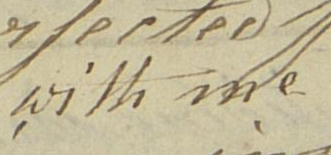with me
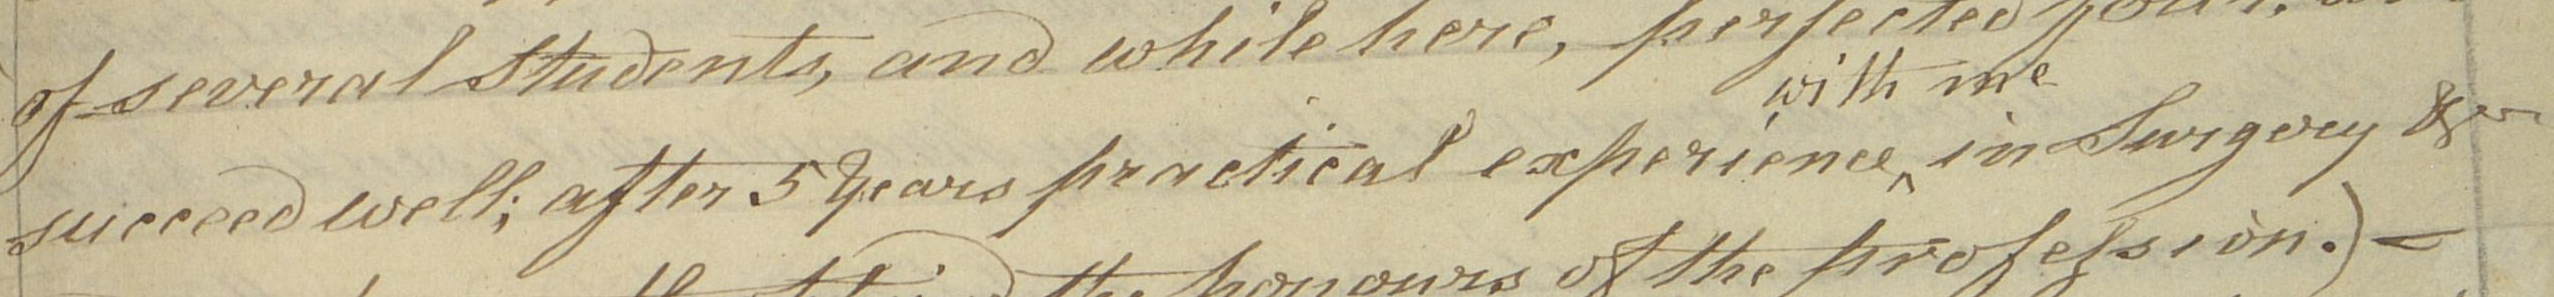succeed well; after 5 Years practical experience ^ in Surgery &c
